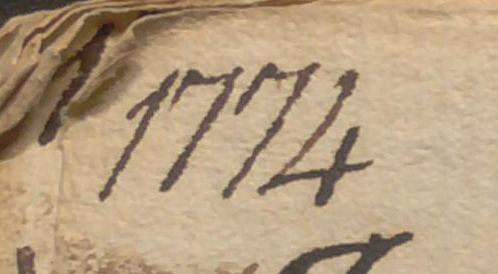1774
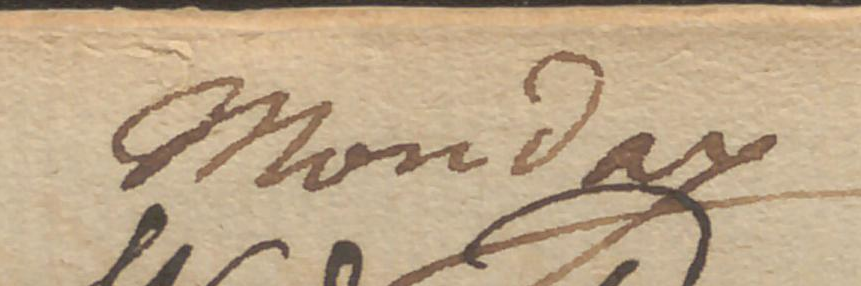Monday
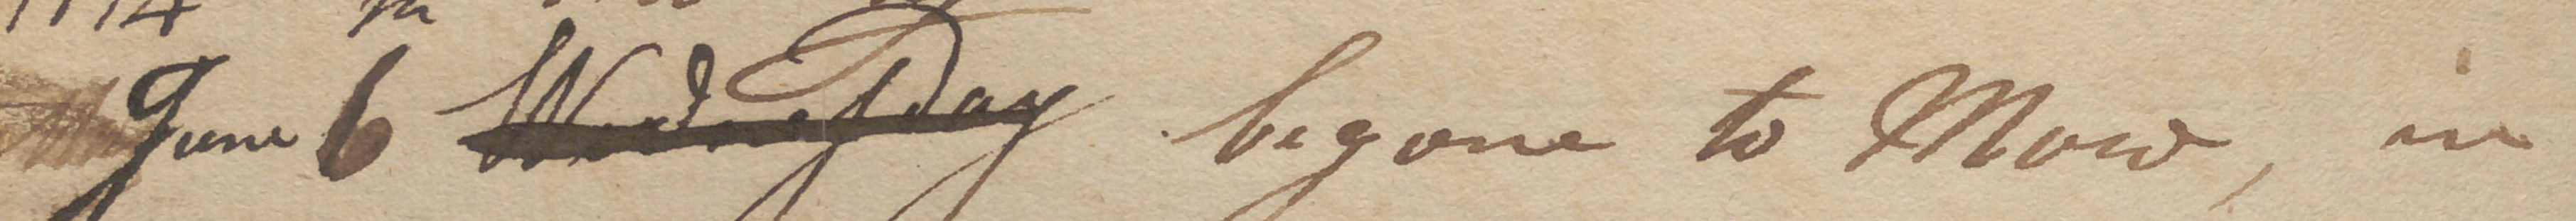June 6^th [Wednesday] begone to Mow, in
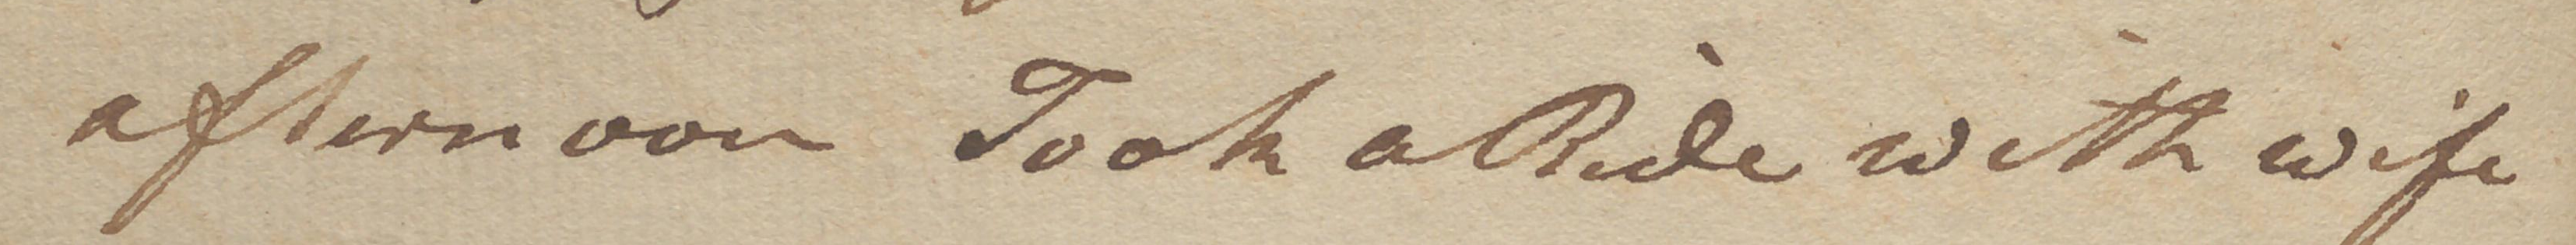afternoon Took a Ride with wife
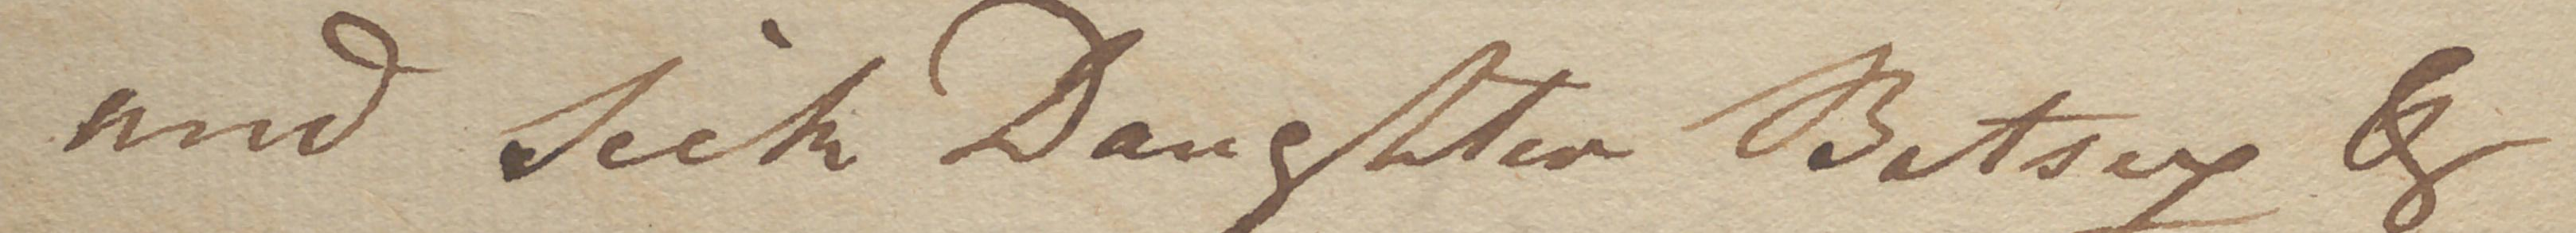and Sick Daughter Betsey &
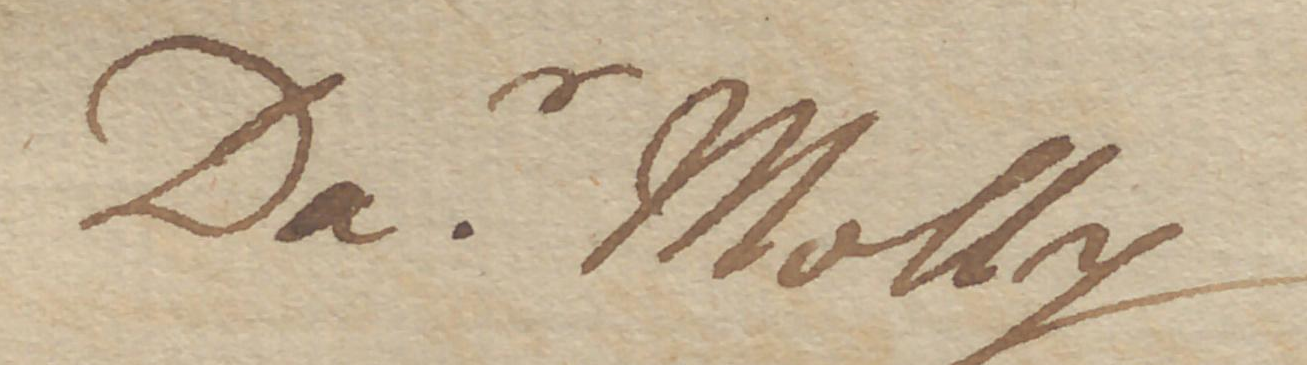Da^r. Molly
